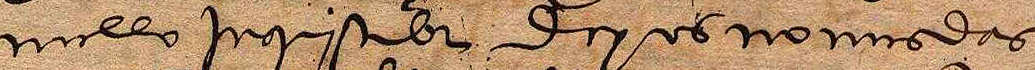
mello Jnqujsidor dey os nomes das
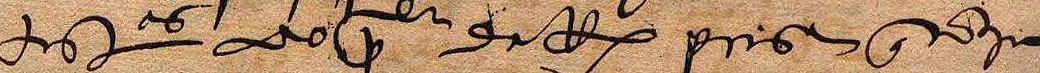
testas ao p̄dor da Rꝭ presa q̄ c̄otra
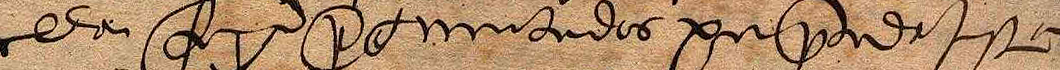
ella forā ꝑgumtadas por p̄te da Justa
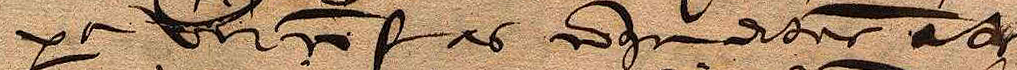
ꝑa vir c̄o suas cōtraditas ate
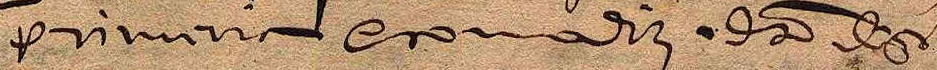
primeira e como diz o dtō desē
